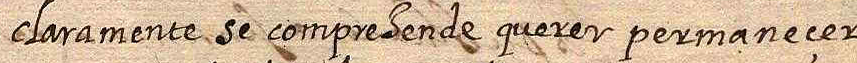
claramente se comprehende querer permanecer
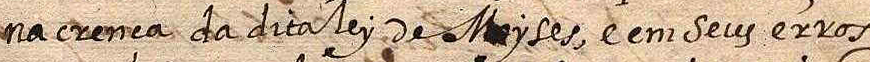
na crença da dita ley de Moyses, e em seus erros
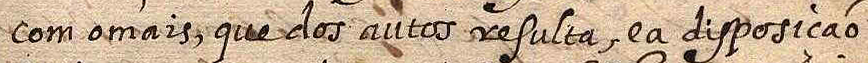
com o mais, que dos autos resulta, e a disposição
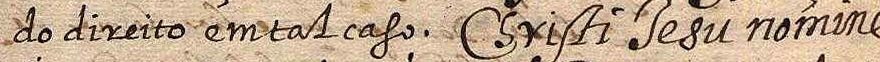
do direito em tal caso. Christi Jesu nomine
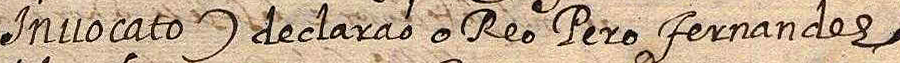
Inuocato) declaraõ o Reo Pero fernandes
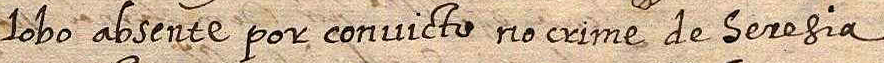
lobo absente por conuicto no crime de heresia
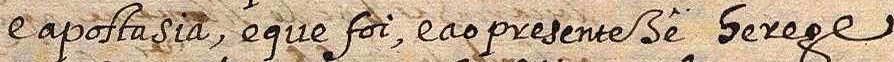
e apostasia, e que foi, e ao presente hé herege
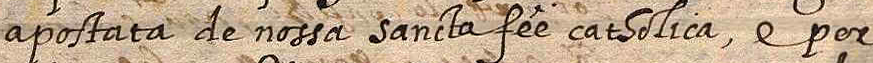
apostata de nossa sancta feé catholica, e per
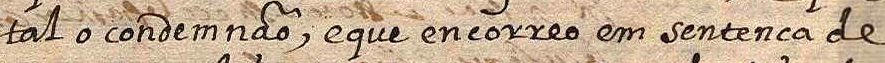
tal o condemnão, e que encorreo em sentença de
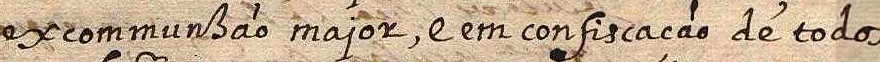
excommunhão major, e em confiscação de todos
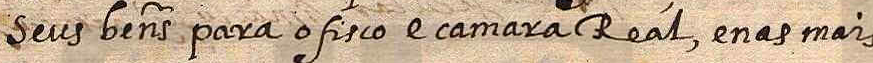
seus ben̄s para o fisco e camara ReaL, e nas mais
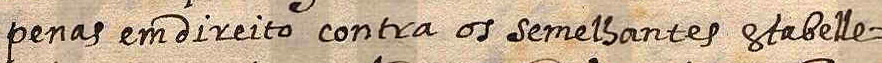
penas em direito contra os semelhantes estabelle
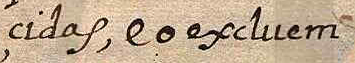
cidas, e o excluem
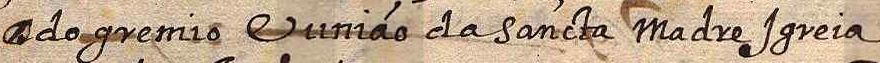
do gremio e união da sancta madre Jgreia
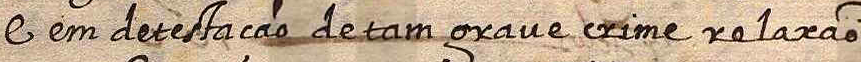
e em detestação de tam graue crime relaxão
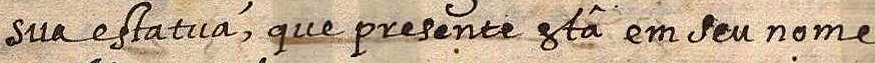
sua estatua, que presente está em seu nome
